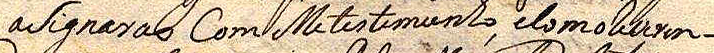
asignarao Com elle testemunho, e com o Reveren
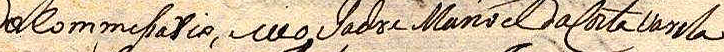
do Commissario, e eu o Padre Manoel da Costa varela
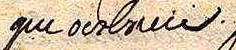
que o esCreui.
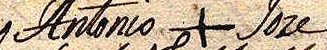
Antonio + Joze
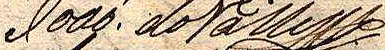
Joaõ. do Valle
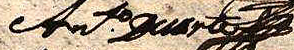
Ant.o Duarte
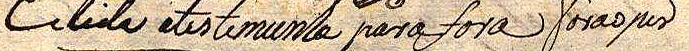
E hida a testemunha para fora forao per
